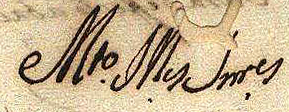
M.to Ill.es Snr.es
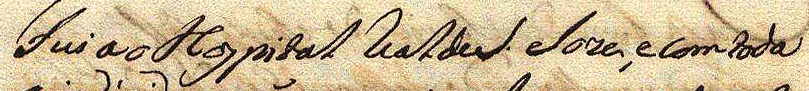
Fui ao Hospital Real de S. Ioze, e com toda
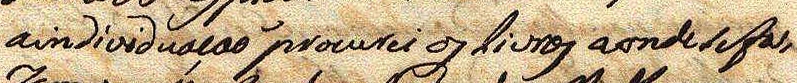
a individuaçaõ procurei os Livros aonde se fa,
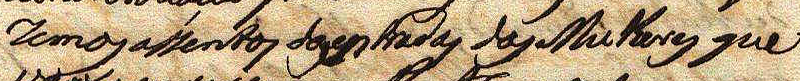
zem os assentos das entradas das Mulheres que
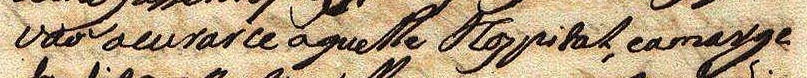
vaõ a curarce aquelle Hospital, e a marge
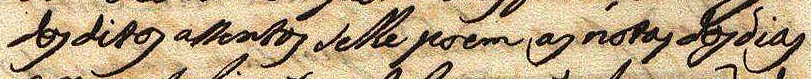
dos ditos assentos selhe poem as notas dos dias
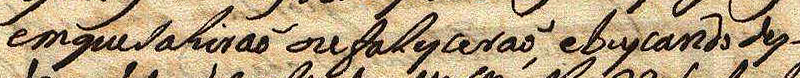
em que sahiraõ ou falesceraõ, e buscando des
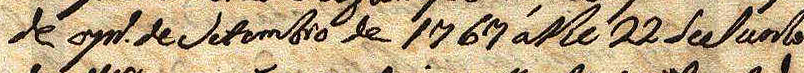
de o pr.o de setembro de 1767 athé 22 de Iunho
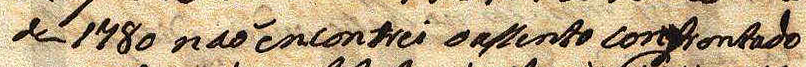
de 1780 naõ encontrei o assento confrontado
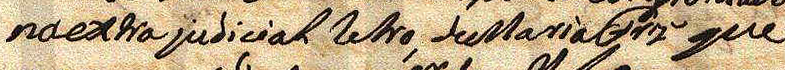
na extra judicial Retro, de Maria Frz̄ que
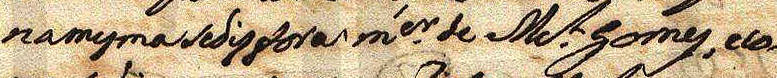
na mesma se dis fora m.er de M.el Gomes, e co
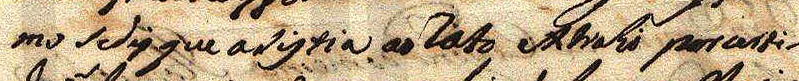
mo se dis que asistia ao Rato extrahi por certi
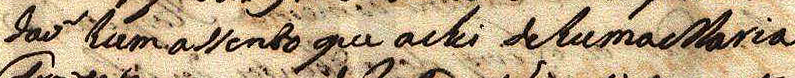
daõ hum assento que achei de huma Maria
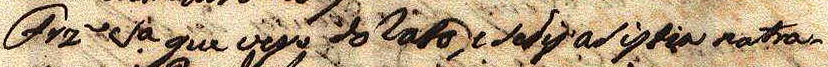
Frz̄ s.a que veyo do Rato, e se dis asistia na tra
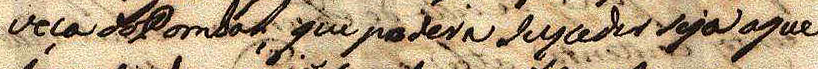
veça do Pombal, que podera susceder seja a que
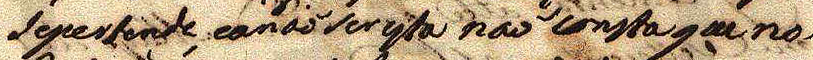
se pertende e a naõ ser esta naõ consta que no
